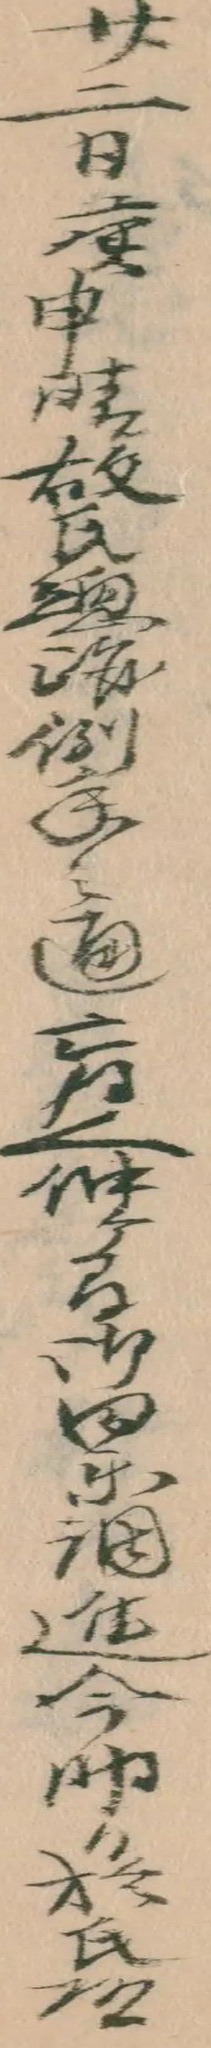廿二日庚申晴故氏總跡例年之通盲人仲ノ間御田楽調進今明日於い氏殿
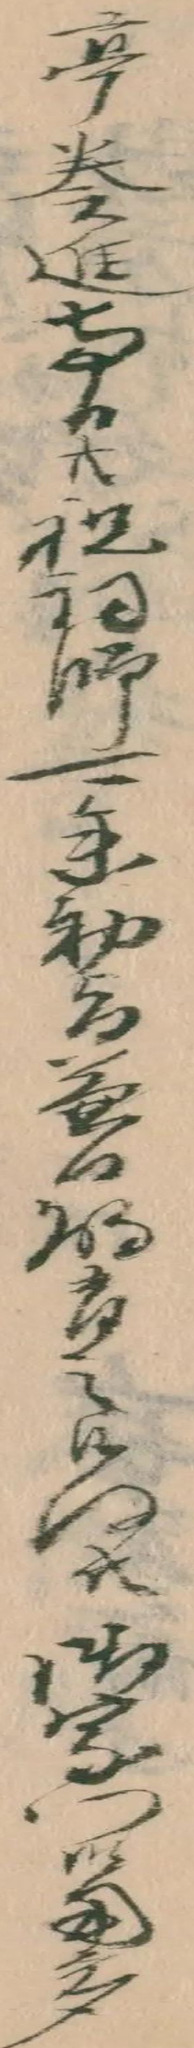亭奏進両日共祝詞師可参勤旨兼日觸有之候得共御家門御用多
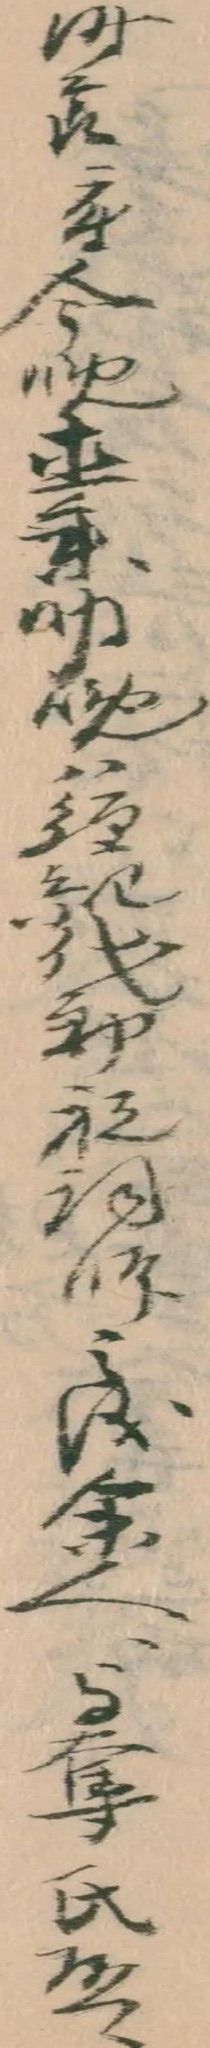時節ニ付今晩直参明晩ハ経紀代勤祝伺師之儀余人へ与奪兵殿へ
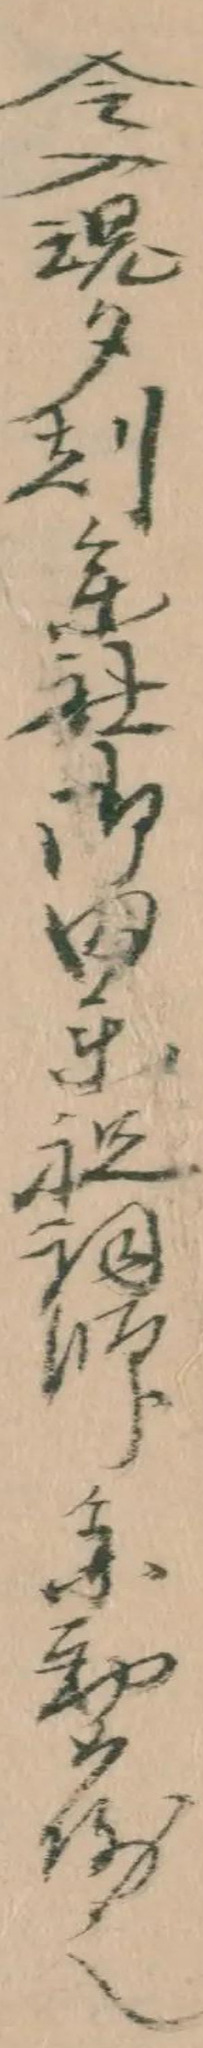令入魂夕刻参社御田楽祝詞師参勤如例也
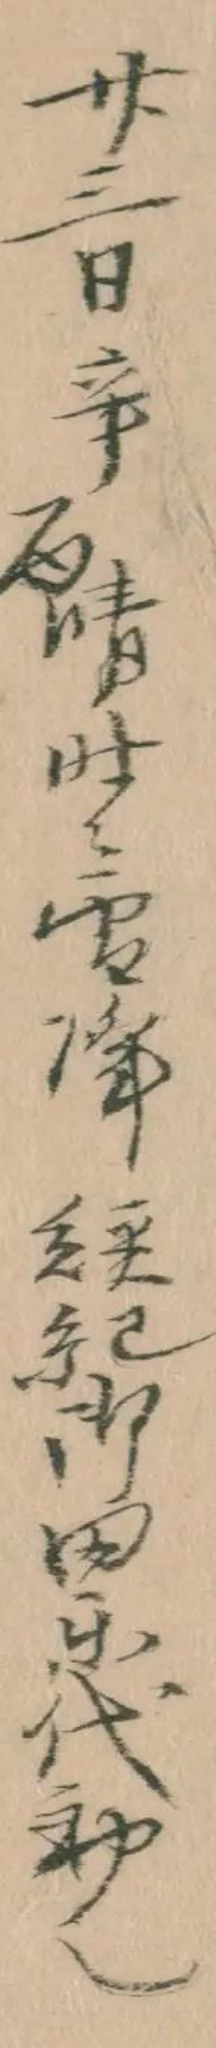廿三日辛酉晴時々雪降経紀御田楽代勤也
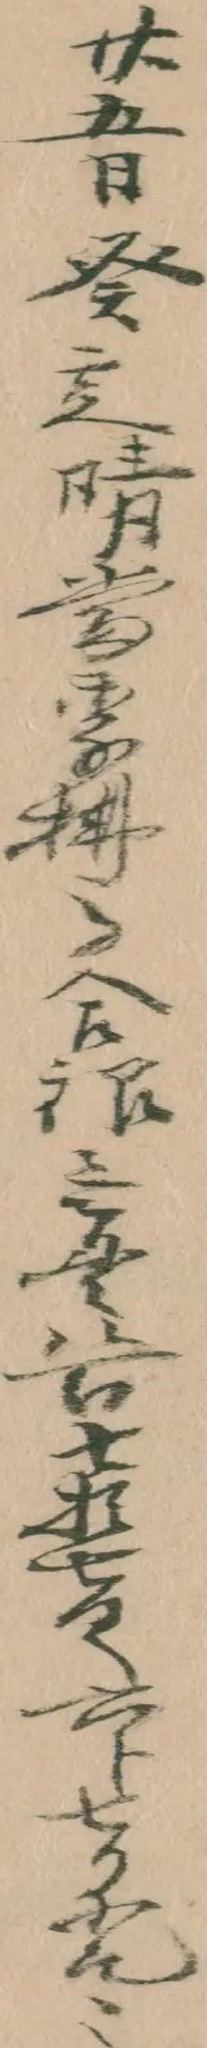廿五日癸亥晴當季払高合銀銀貫八百七拾七匁六分七り五凡也

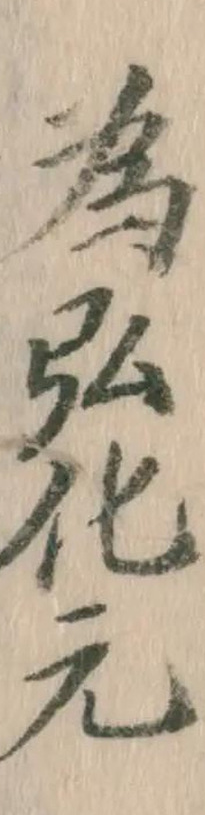為弘化元
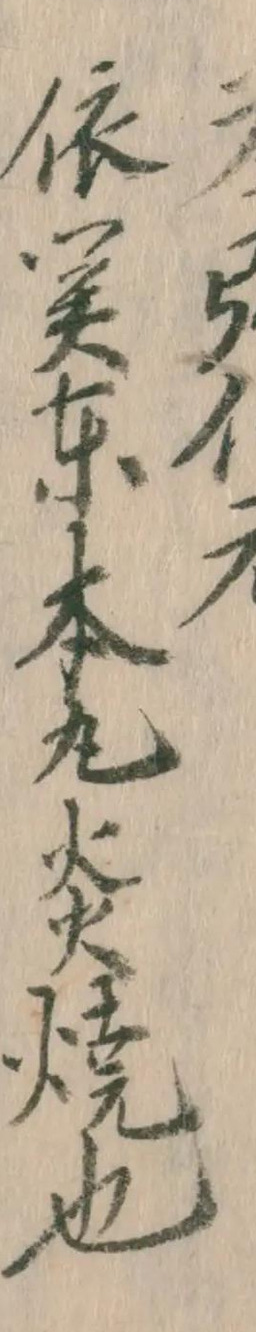依関東本丸炎焼也
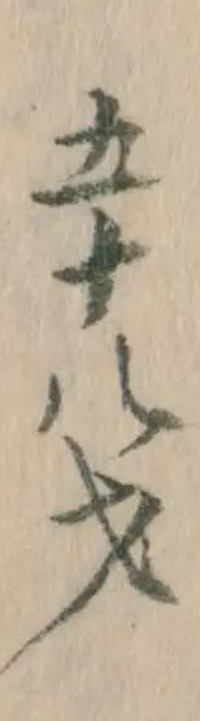五十八才

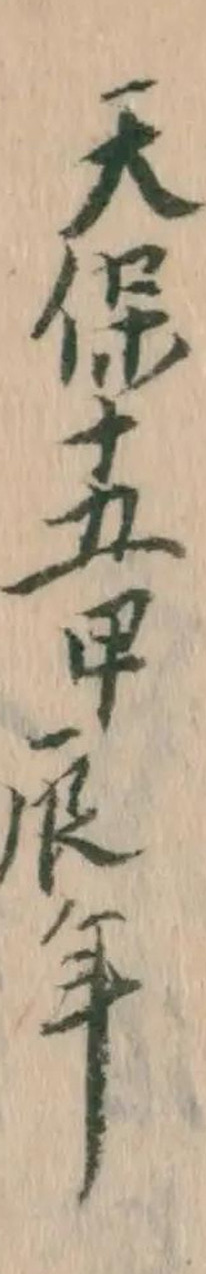天保十五甲辰年
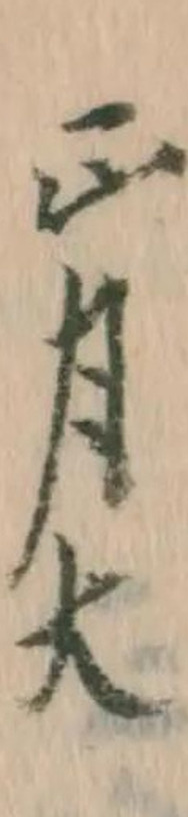正月大
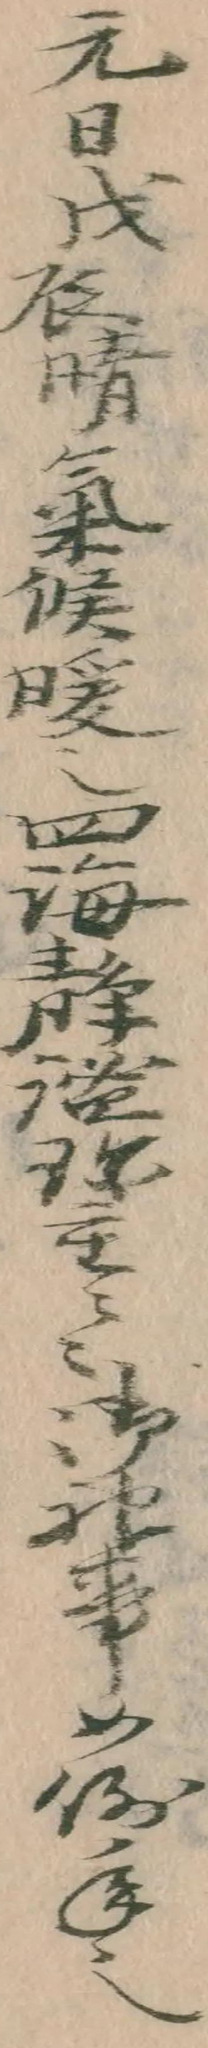元日戊辰晴氣候暖也四海静謐珍重々々御神事如例年也
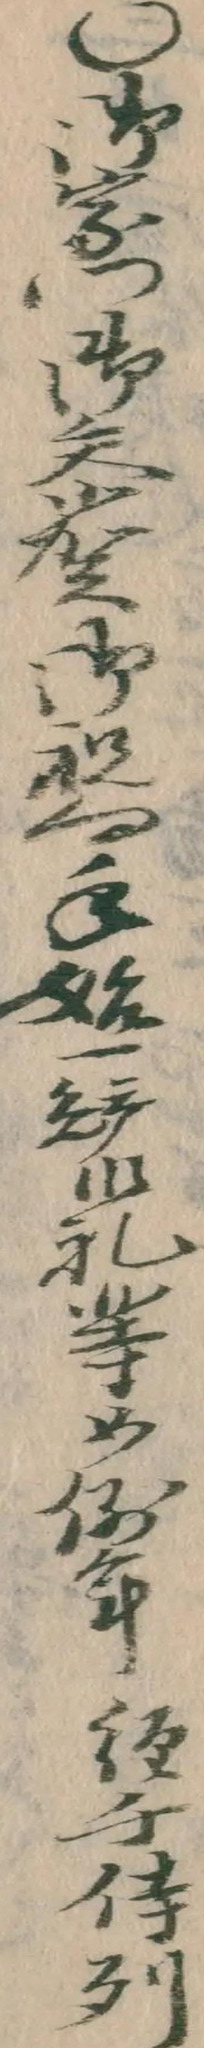○御家門御祭堂御祝向手始一統御礼等如例年経千侍
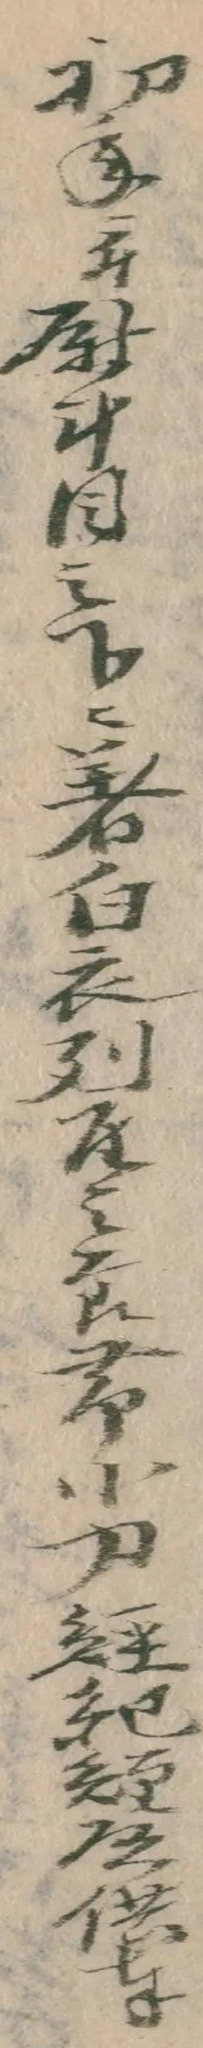初年ニ付熨斗目之下ニ着白衣列座之節帯小刀経紀経啓供奉
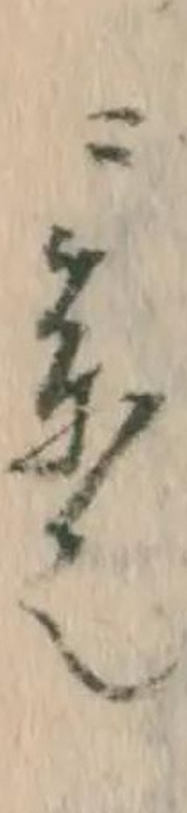ニ参也
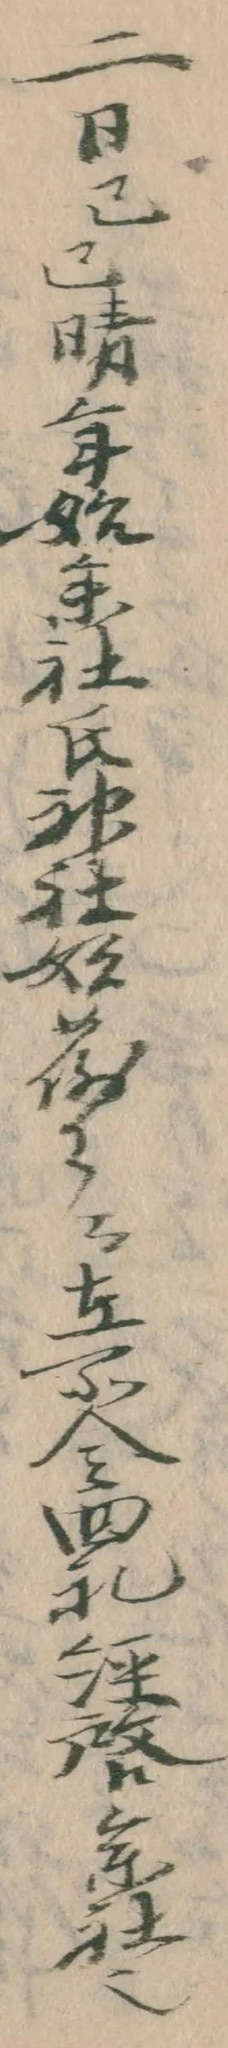二日己巳晴年始末社被神社始如例了而在所令回礼経啓参社也
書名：賀茂社記録. 第69冊
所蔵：国立国会図書館 National Diet Library, JAPAN
